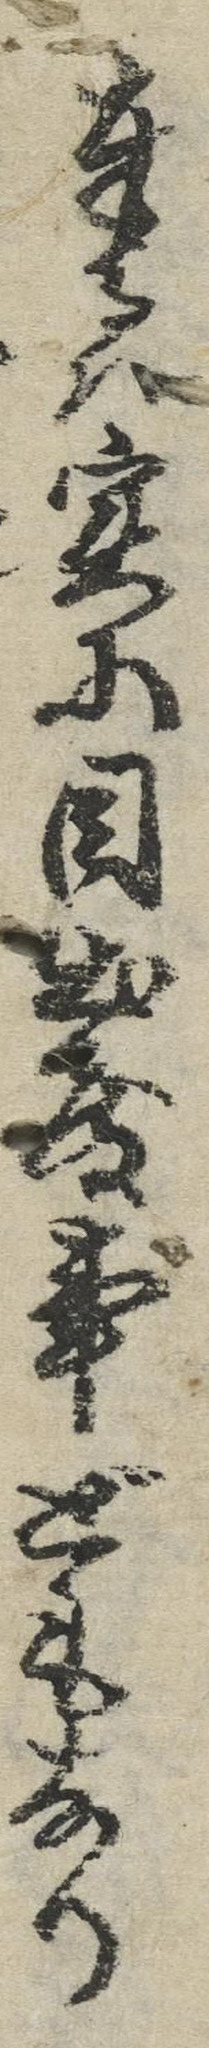奉るハ実に目出度事どもなり
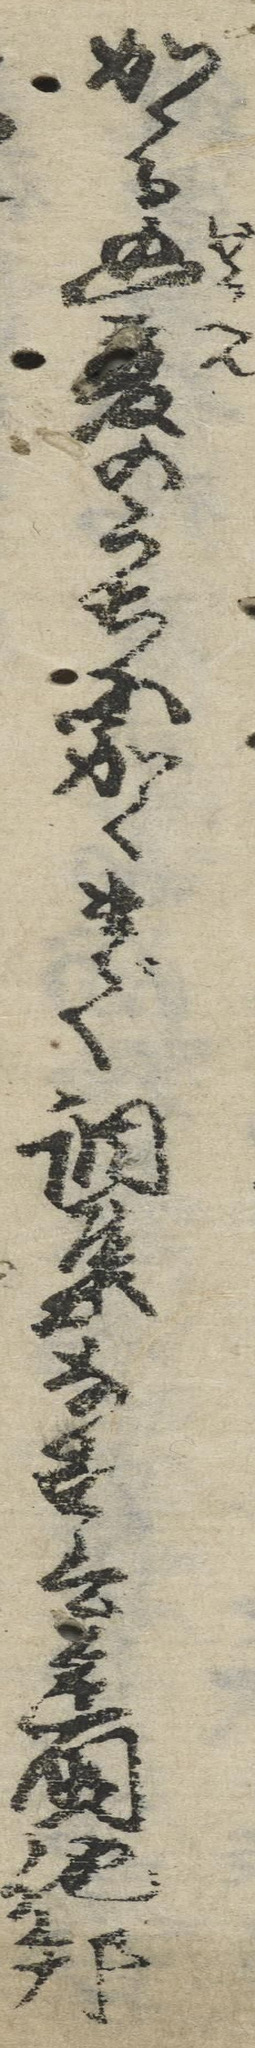かゝる凶変のうちにかくまで調集なすは遠国他邦
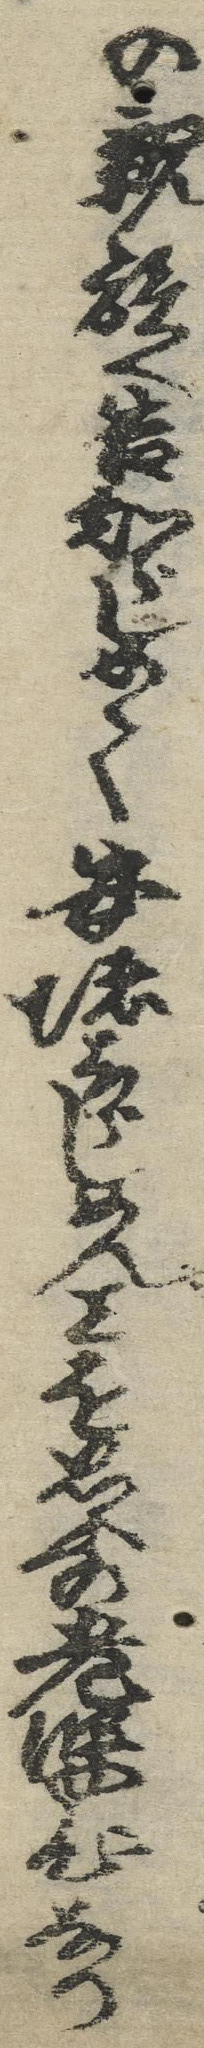の親族へ告ならしめて安堵しらしめんことを思ふの老婆心なり
